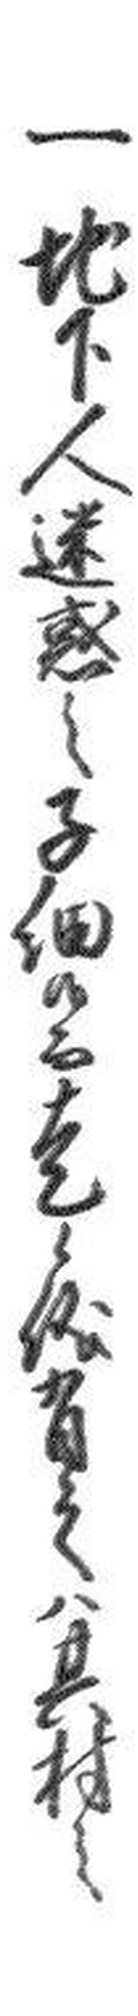一地下人迷惑之子細候而走之儀有之ハ其村之
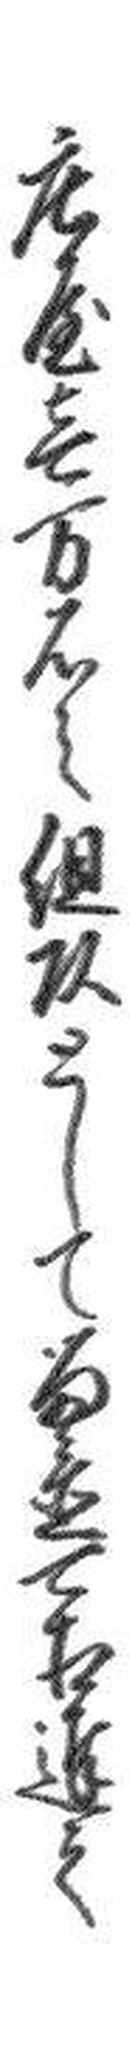庄屋壱万石之組頭として留置可相達之
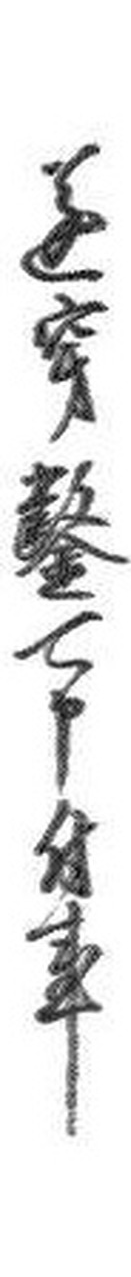遂穿鑿可申付事
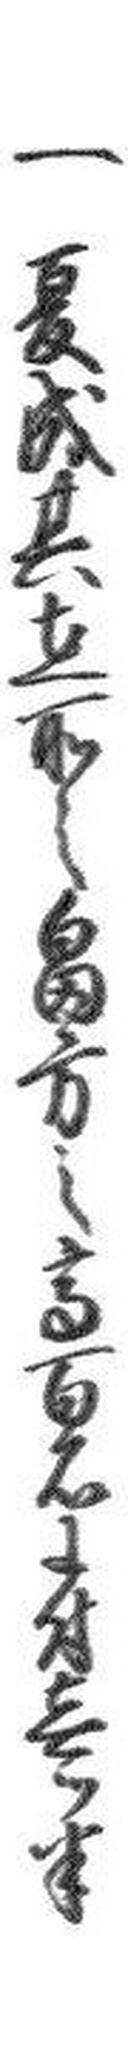一夏成其在所之畠方之高百石に付壱ツ半
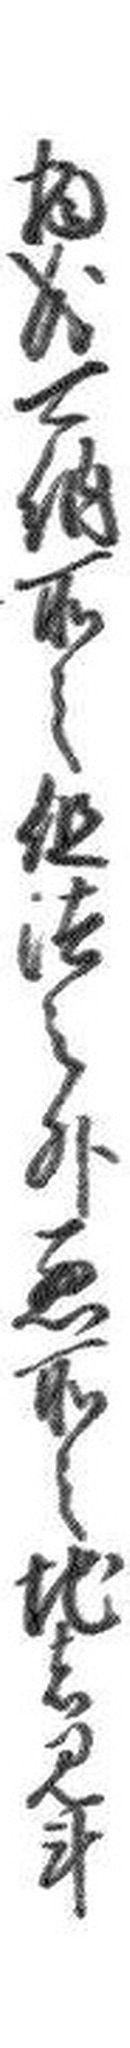物成可納所之但法之外悪所之地者見計
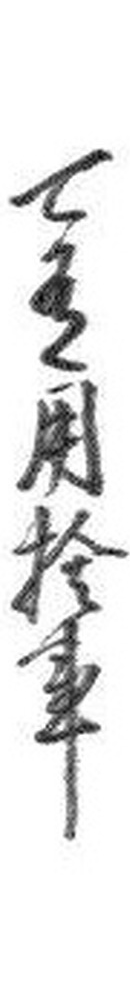可有用捨事
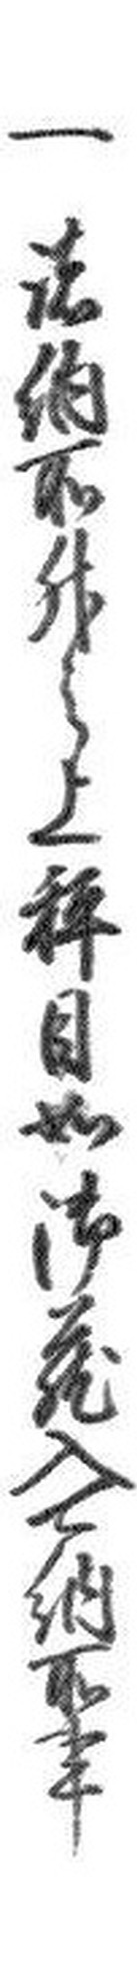一諸納所升之上秤目如御蔵入可納所事
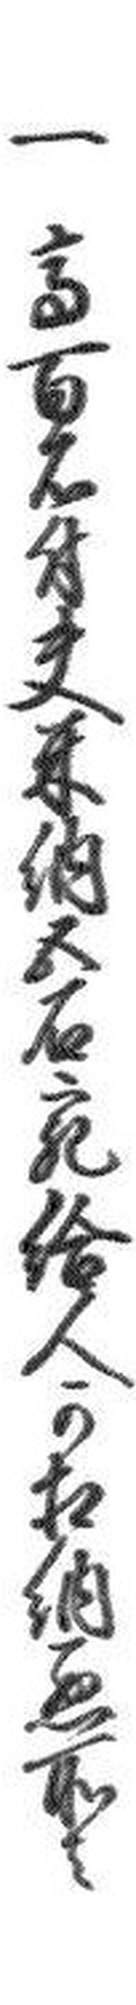一高百石付夫米納五石宛給人可相納悪所者
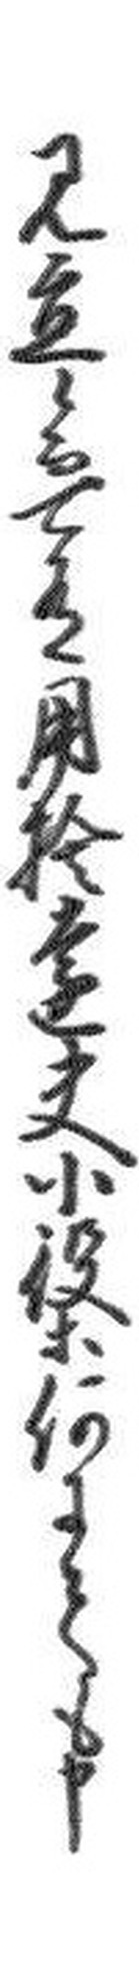見立候而可有用捨遠夫小役等何にても申

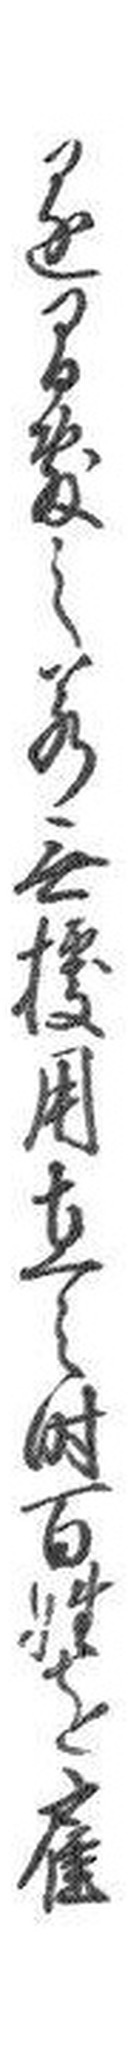賭間敷之若無拠用在之時百姓を雇
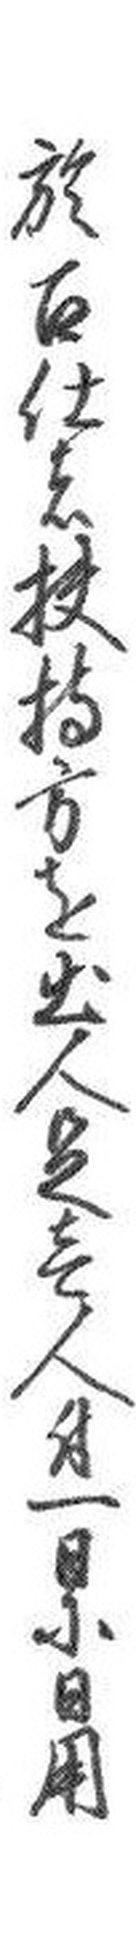於召仕者扶持方を出人足壱人付一日に日用
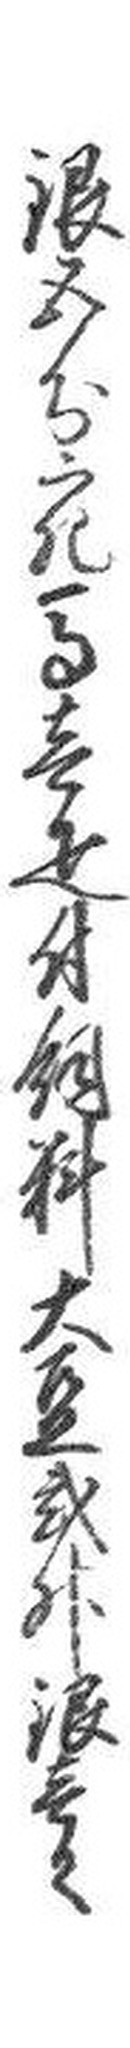銀五分宛馬一疋付飼料大豆弐升銀壱匁
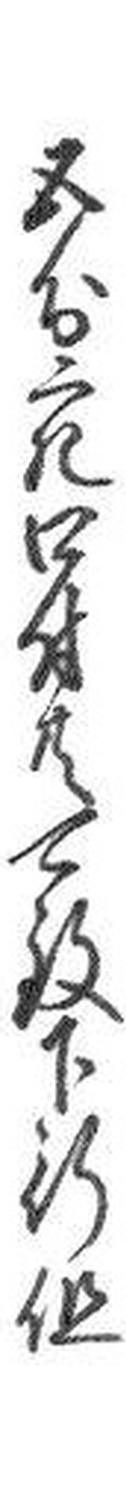五分宛口付共可致下行但
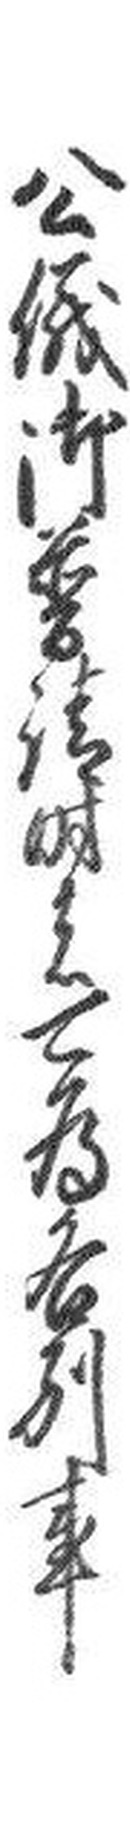公儀御普請時者可為各別事
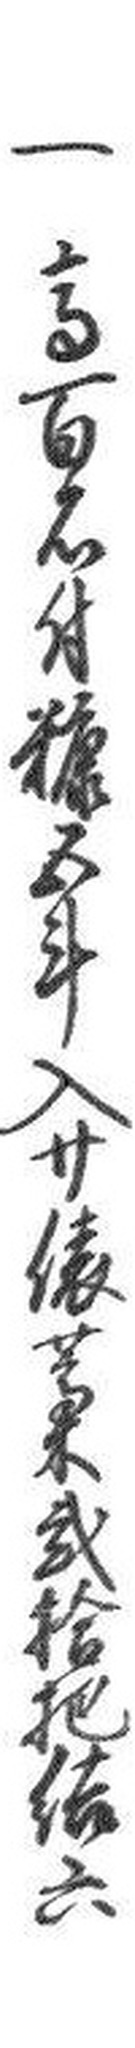一高百石付糠五斗入廿俵藁弐拾把詰六
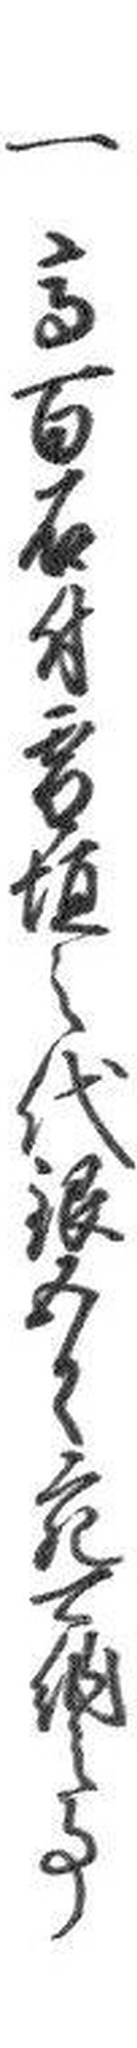一高百石付雪垣之代銀五匁宛可納之事
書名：家譜 十一 昌親公 従延宝二年到延宝四年八月
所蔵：福井県文書館 Fukui Prefectural Archives
